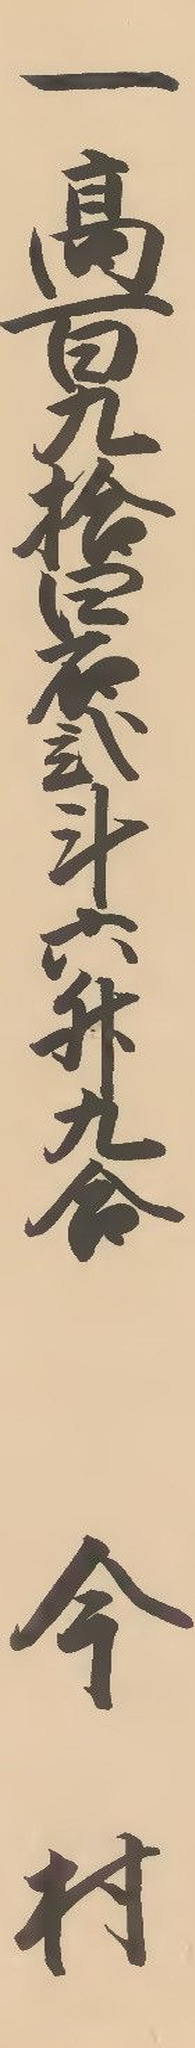一高百九拾四石弐斗六升九合今村
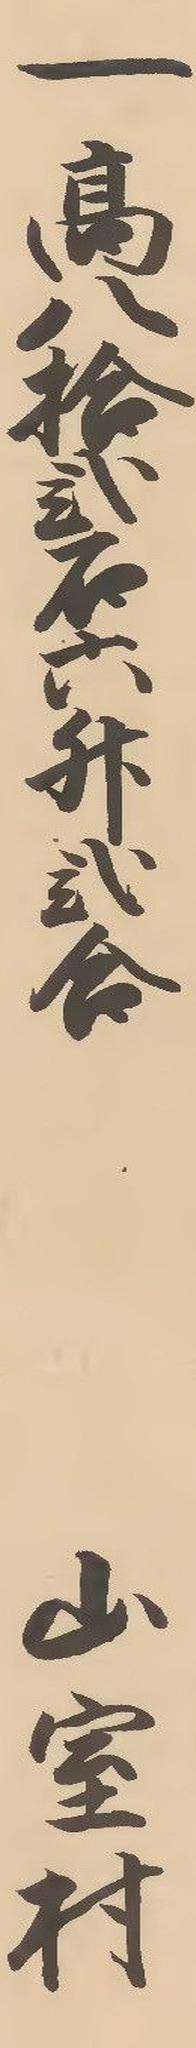一高八拾弐石六升弐合山室村
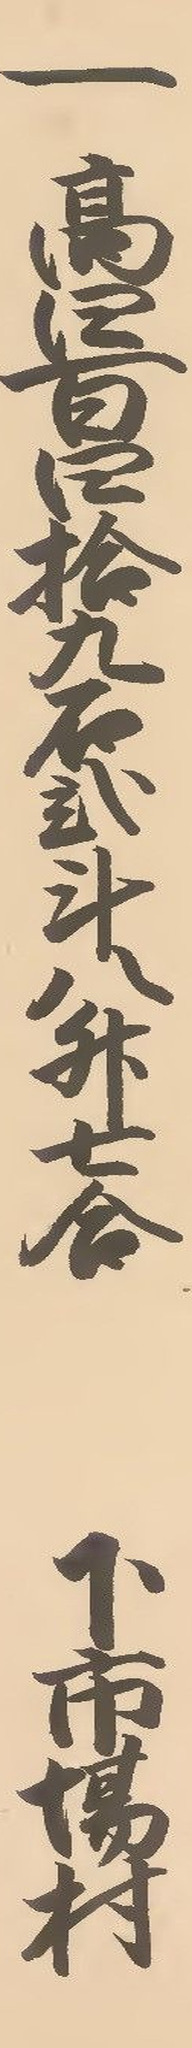一高四百四拾九石弐斗八升七合下市場村
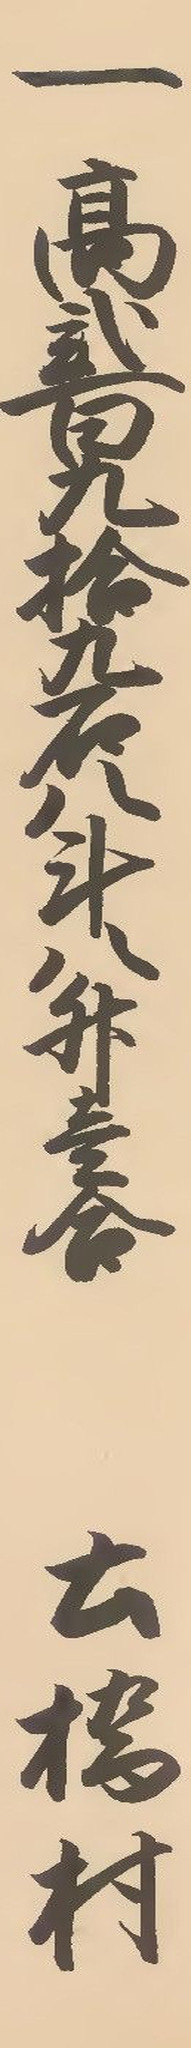一高弐百九拾九石八斗八升壱合土橋村
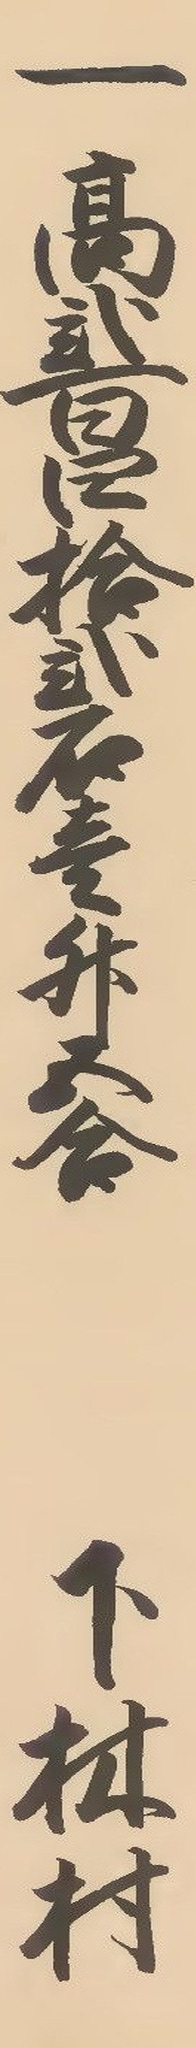一高弐百四拾弐石壱升五合下林村
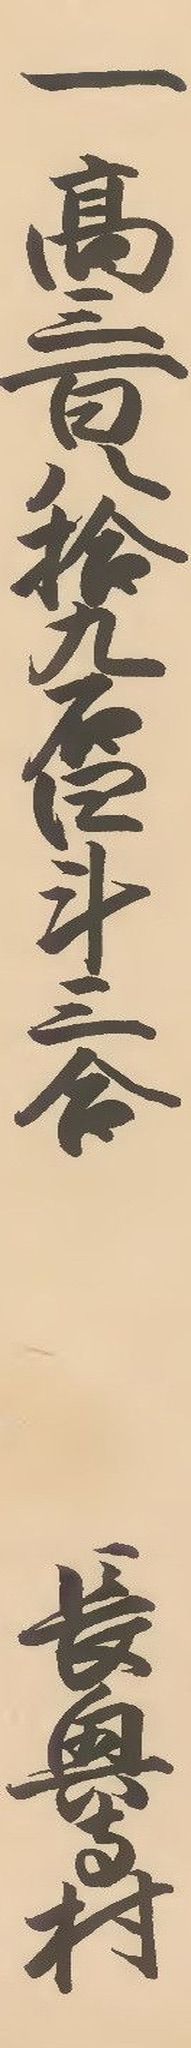一高三百八拾九石四斗三合長興寺村

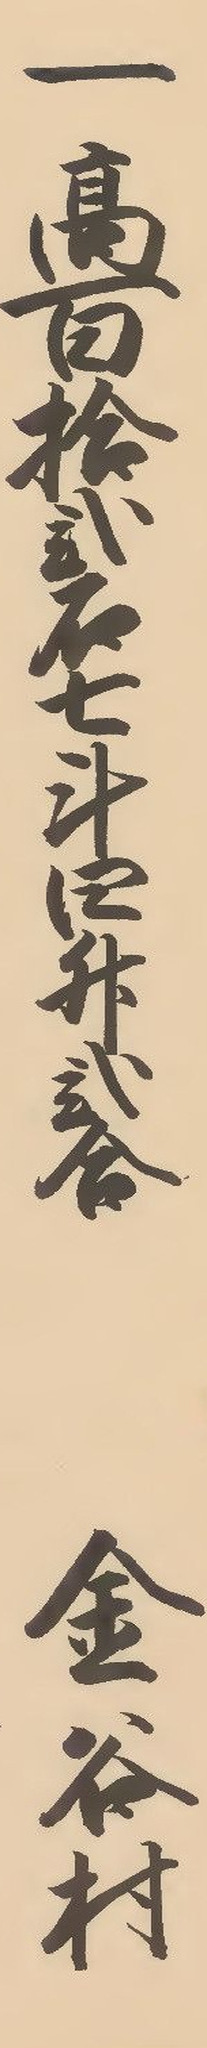一高百拾弐石七斗四升弐合金谷村
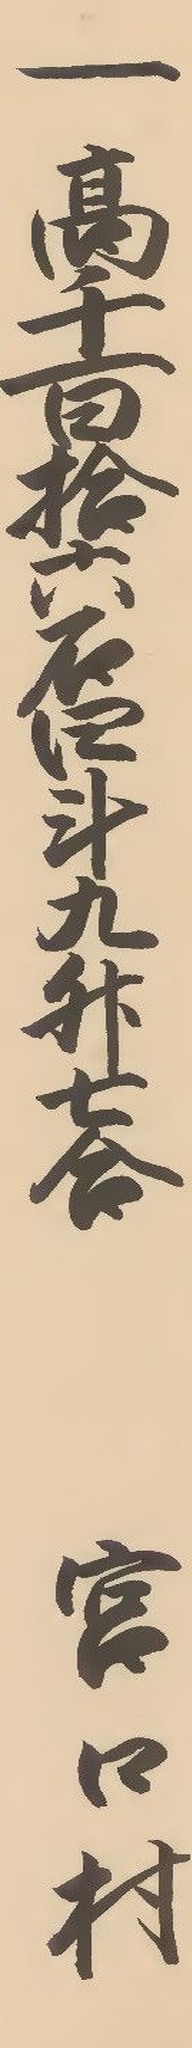一高千百拾六石四斗九升七合宮口村
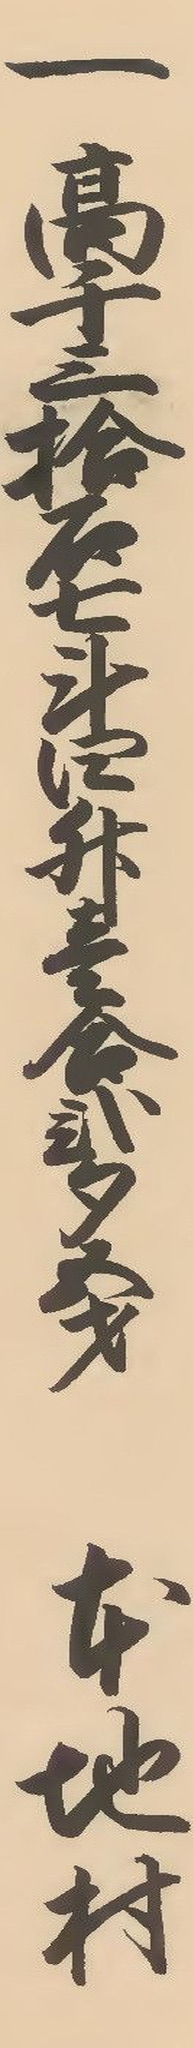一高千三拾石七斗四升壱合弐勺五才本地村
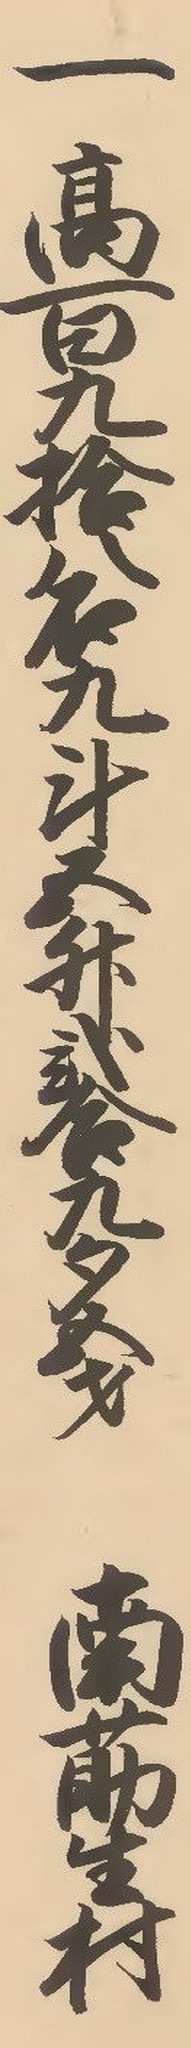一高百九拾八石九斗五升弐合九勺五才南莇生村
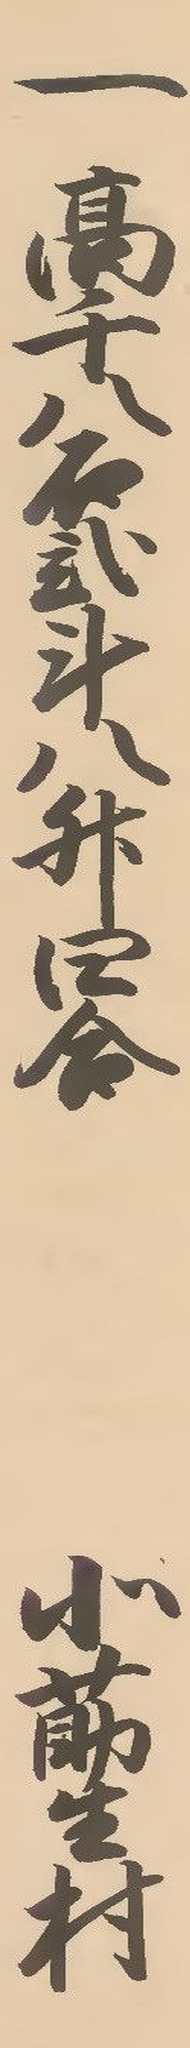一高千八石弐斗八升四合北莇生村
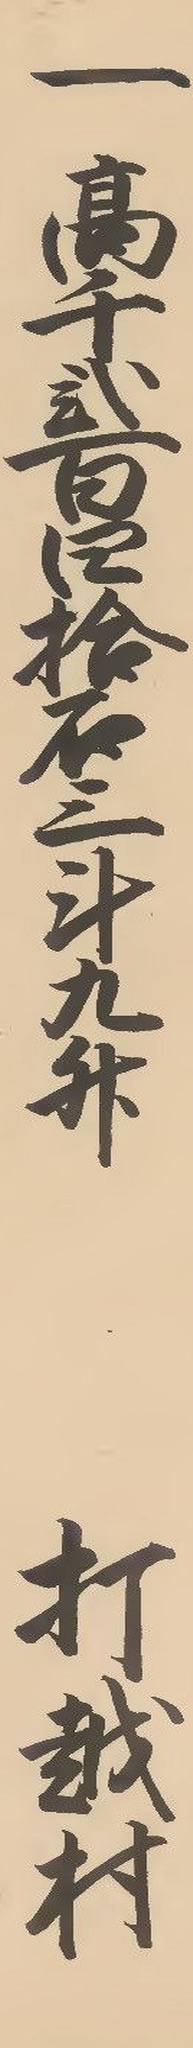一高千弐百四拾石三斗九升打越村
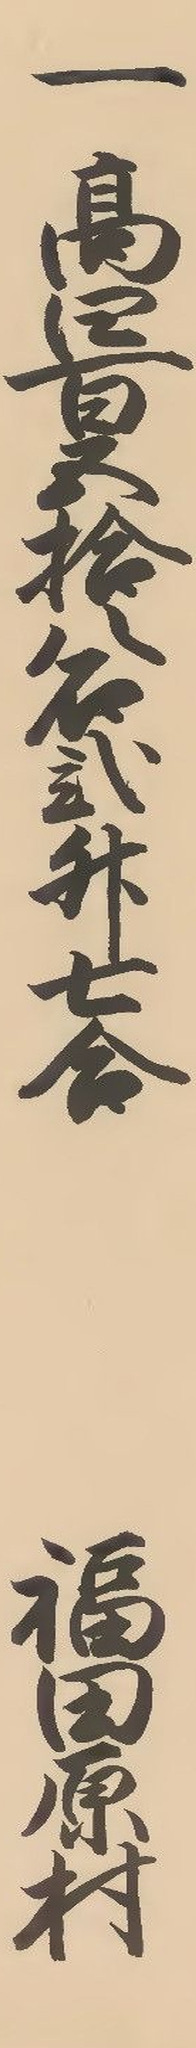一高四百五拾八石弐升七合福田原村
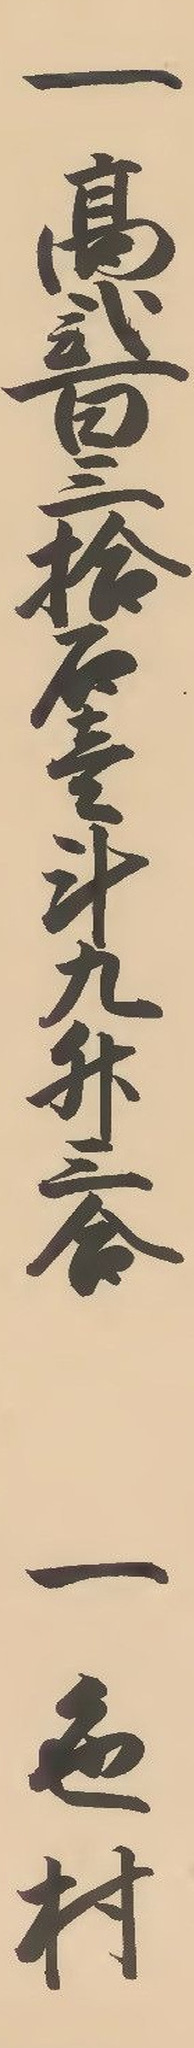一高弐百三拾石壱斗九升三合一色村

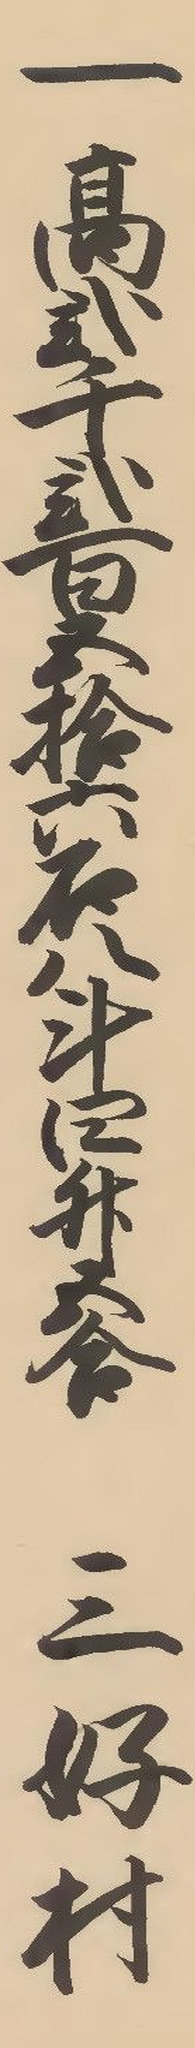一高弐千弐百五拾六石八斗四升五合三好村
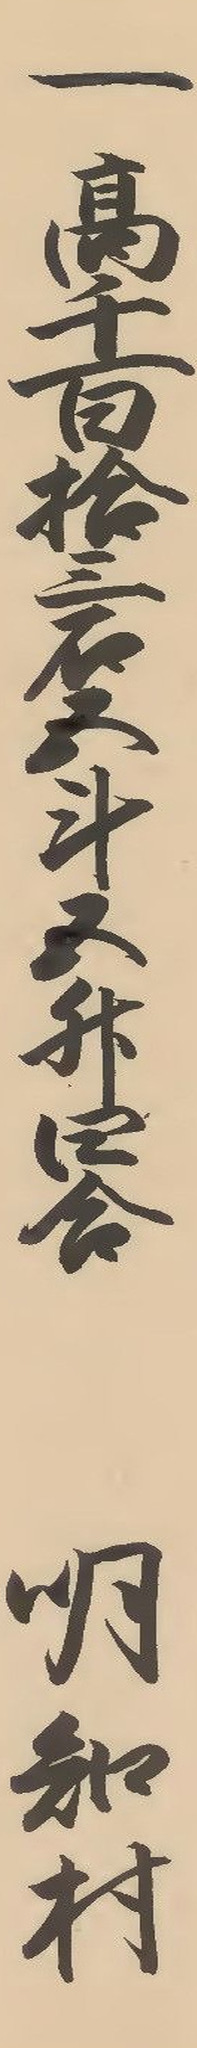一高千百拾三石五斗五升四合明知村
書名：三河国郷帳
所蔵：国立公文書館 National Archives of Japan
